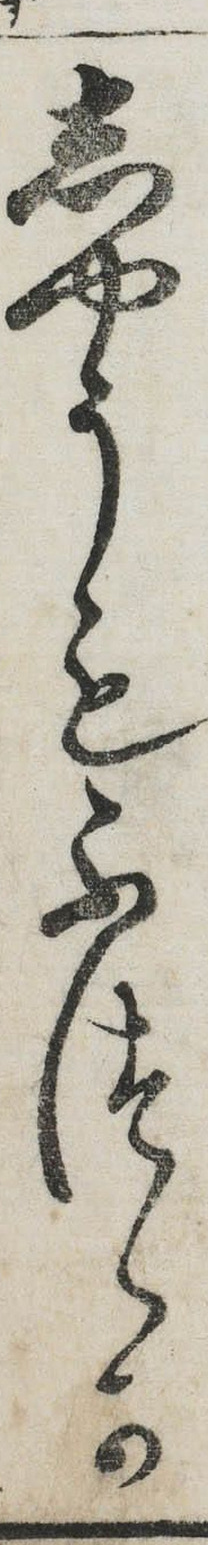しやうもふつゝか
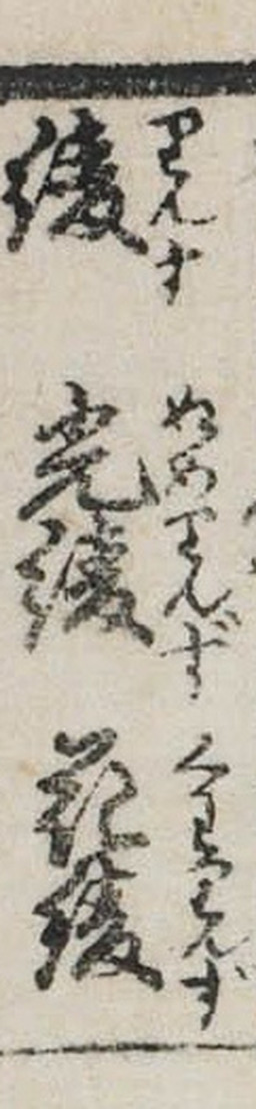綾光綾花綾
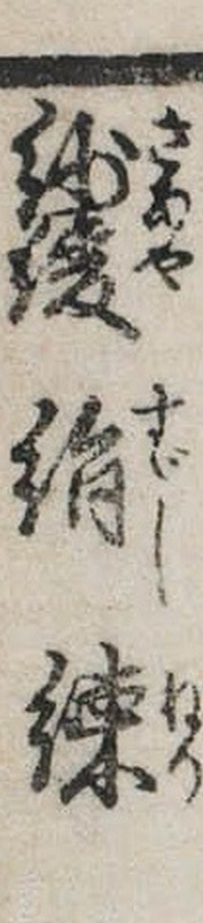紗綾絹練
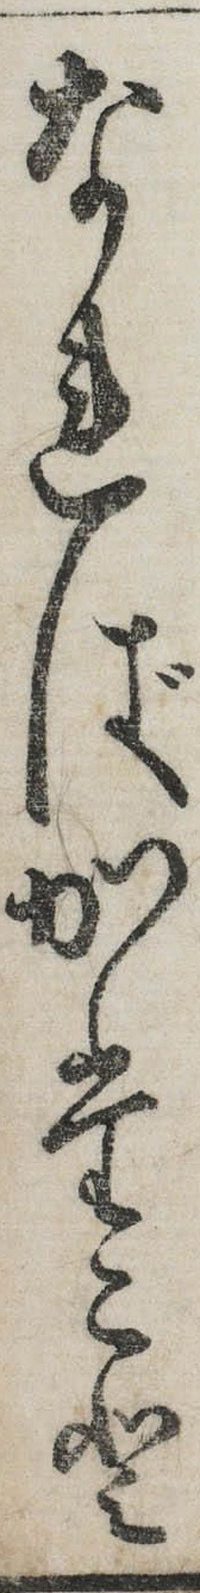なればかたこと

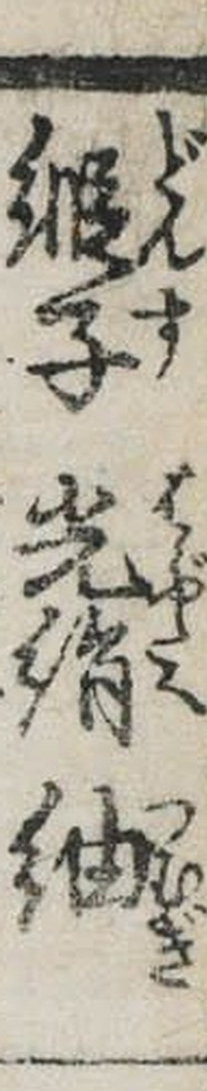緞子光絹紬
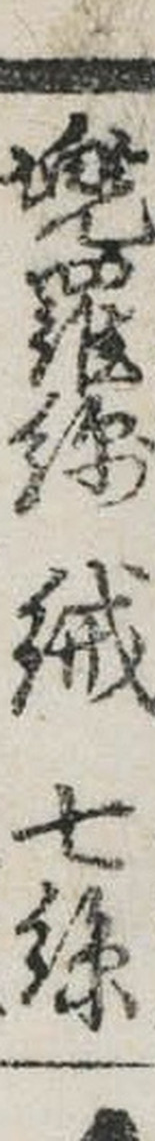兜羅綿絨七綿
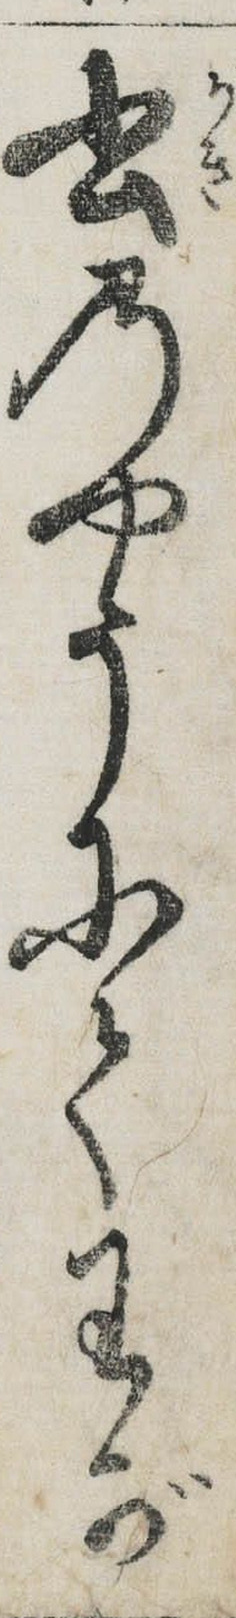書のやうにてわが
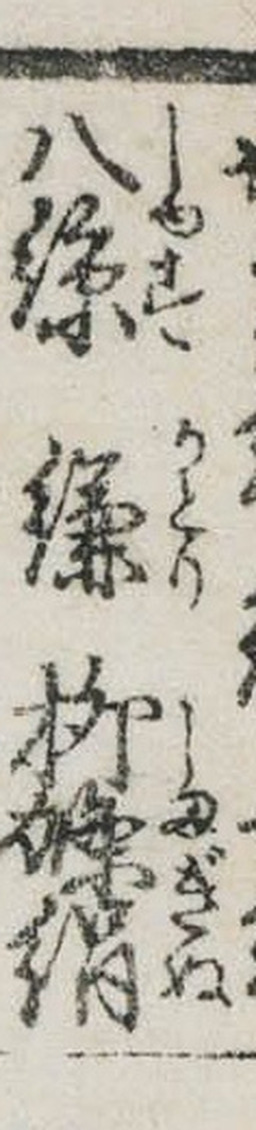八綿縑柳條絹
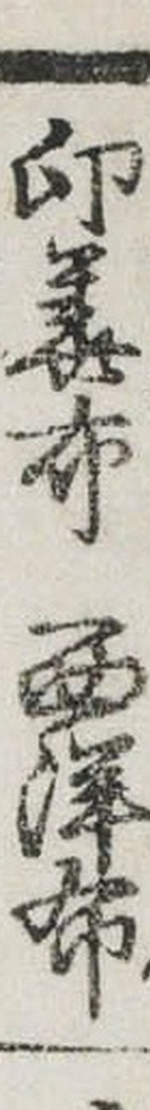印美布西洋布
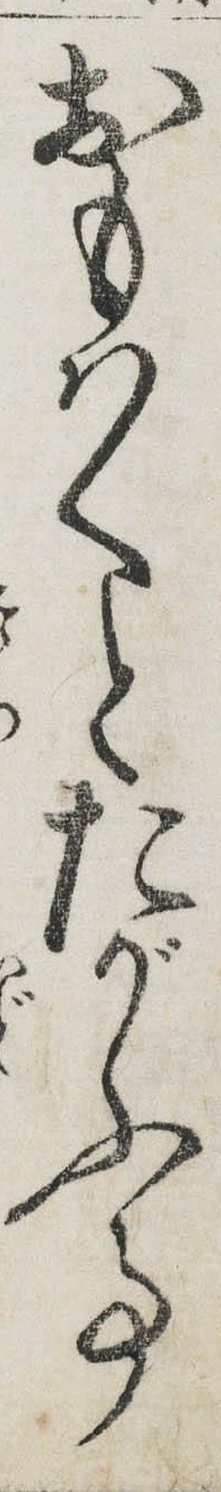おもはくとたがふ事
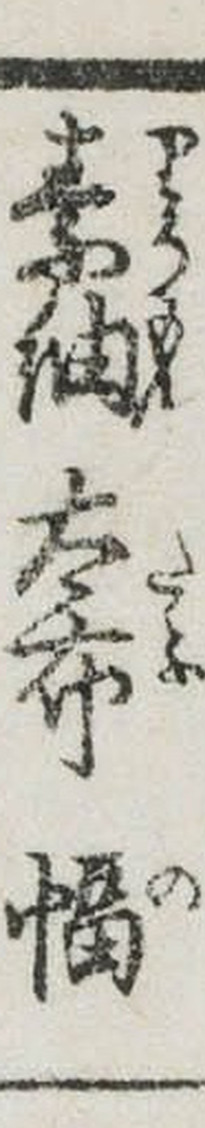素紬太布幅
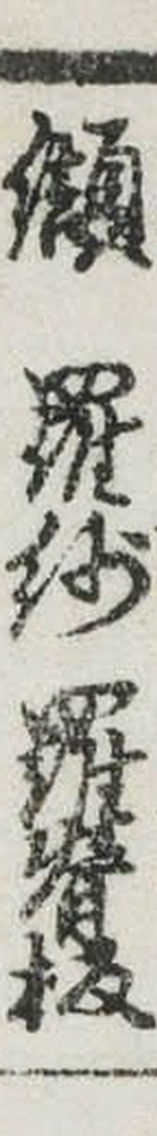纈羅紗羅背板
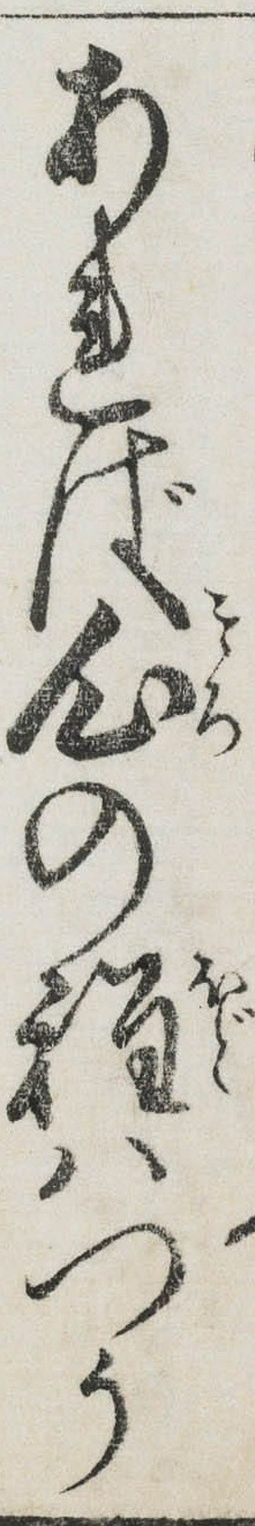あれば心の程はつう
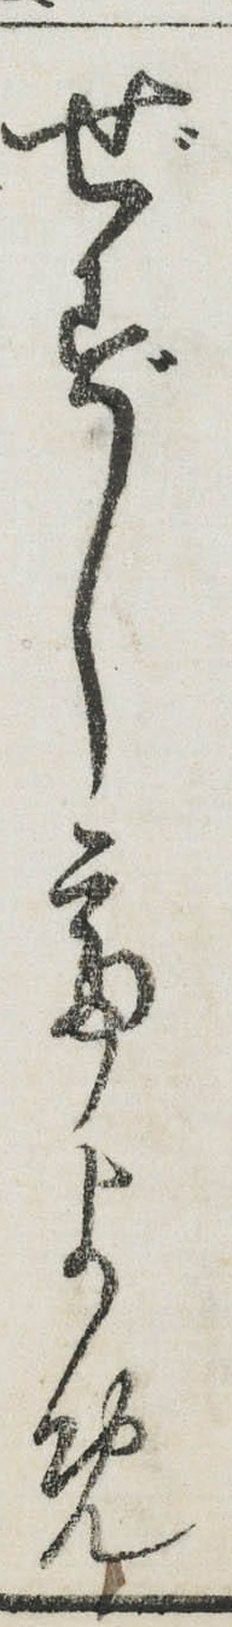ぜずしてよめ
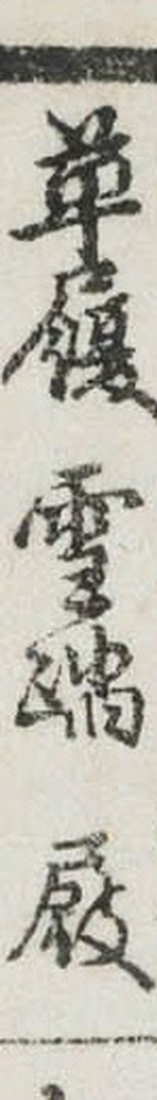草履雪踏履
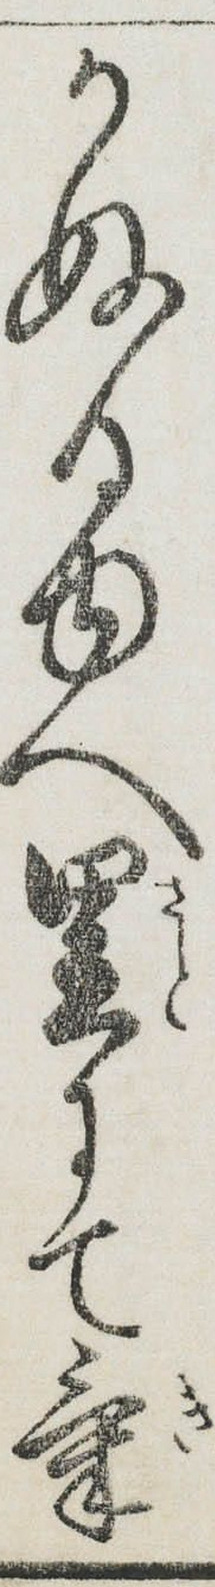かぬるゆへ里にて気
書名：頭書萬用婦人手紙之文言
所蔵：東京学芸大学教育コンテンツアーカイブ
